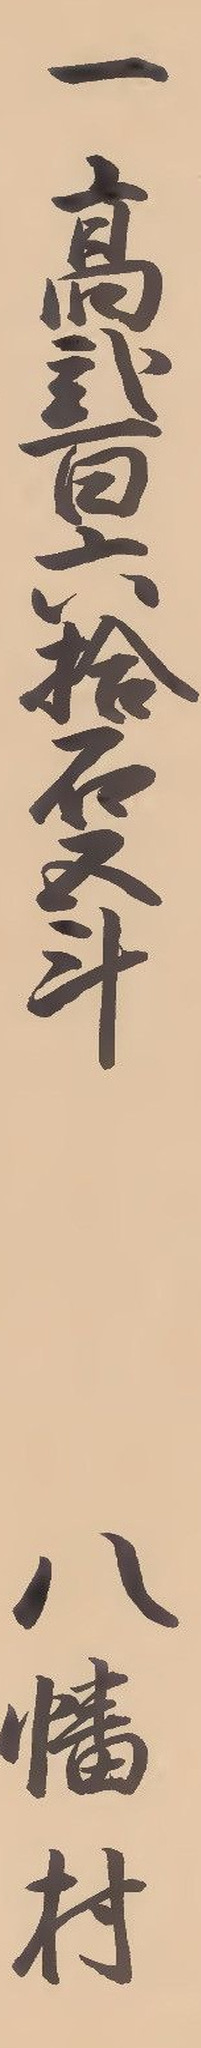一高弐百六拾石五斗八幡村
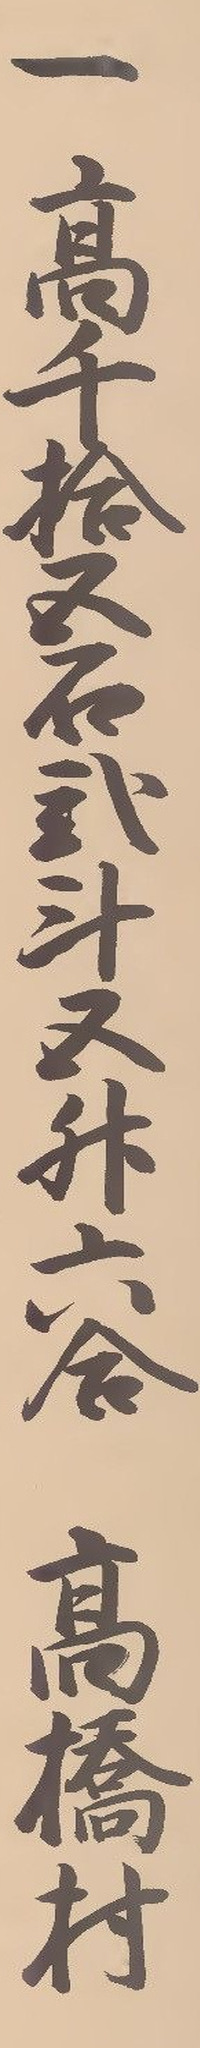一高千拾五石弐斗五升六合高橋村
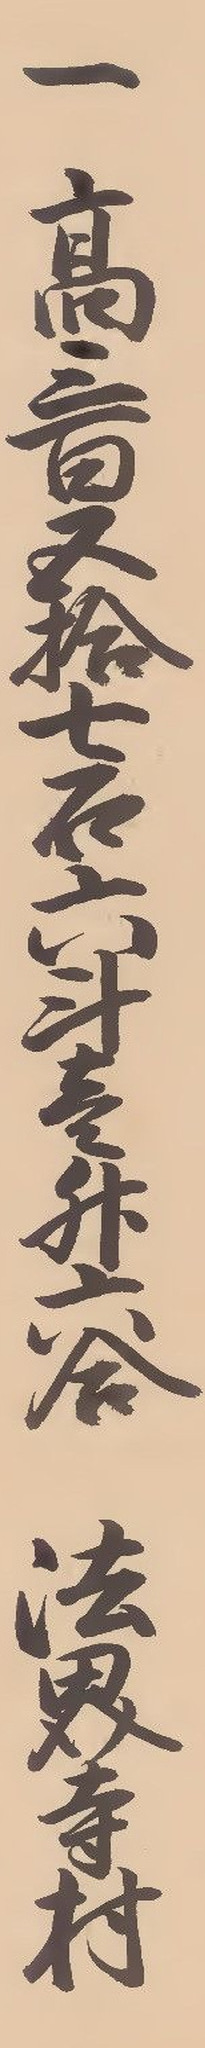一高三百五拾七石六斗壱升六合法界寺村
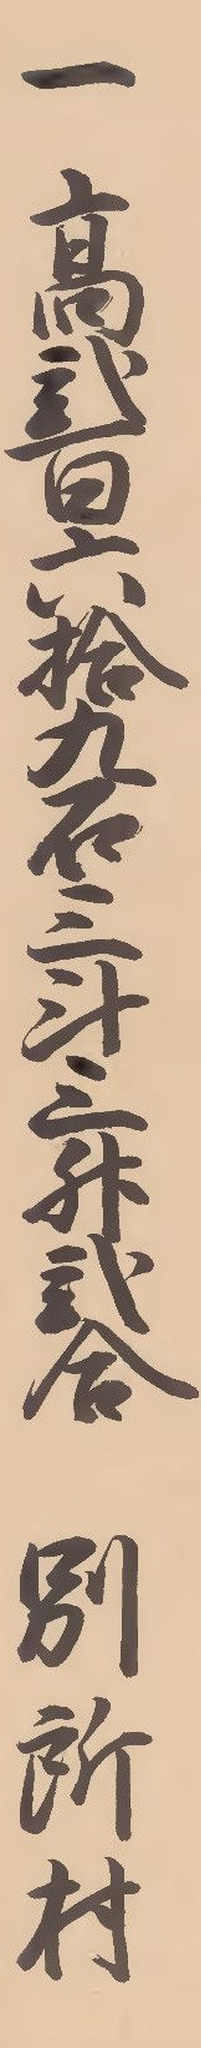一高弐百六拾九石三斗三升弐合別所村
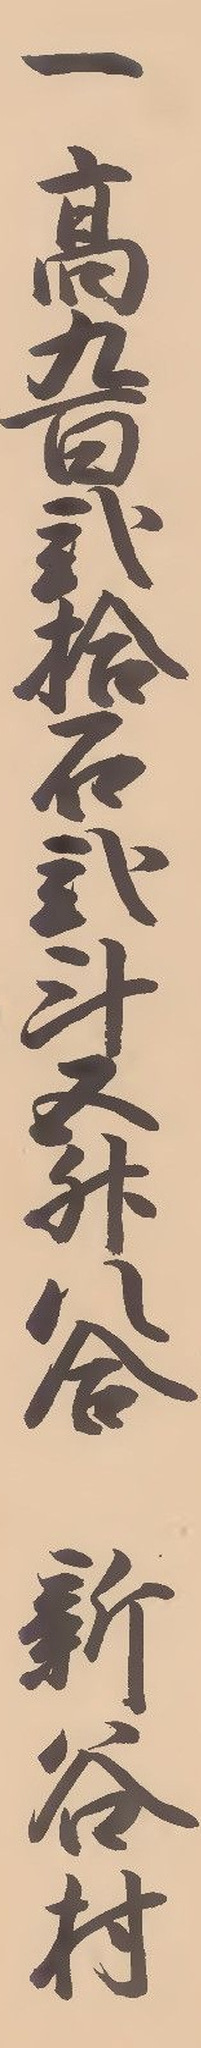一高九百弐拾石弐斗五升八合新谷村

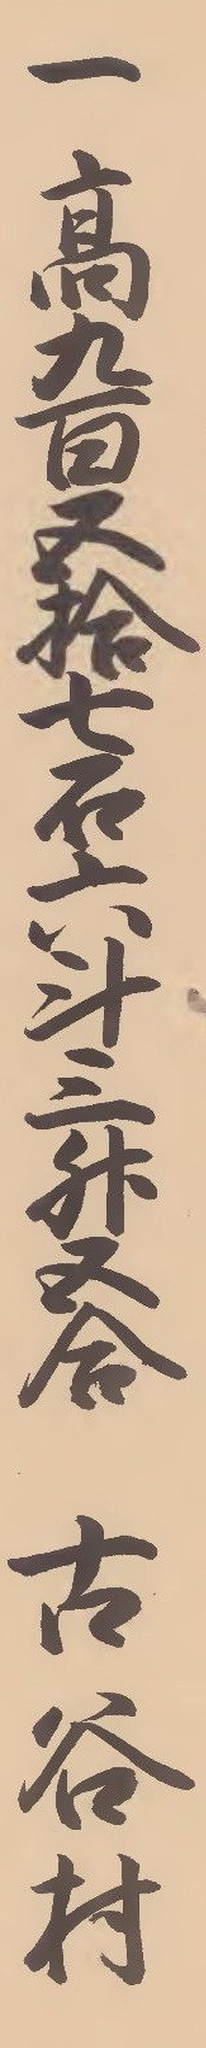一高九百五拾七石六斗三升五合古谷村
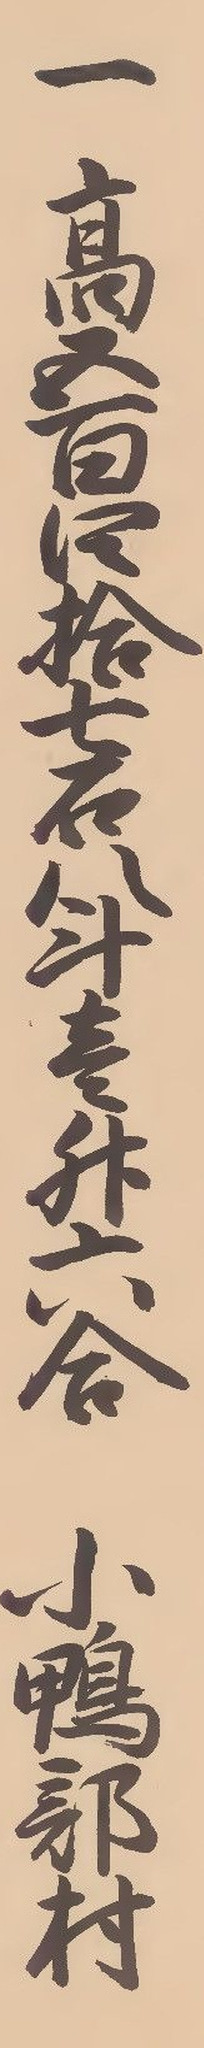一高五百四拾七石八斗壱升六合小鴨部村
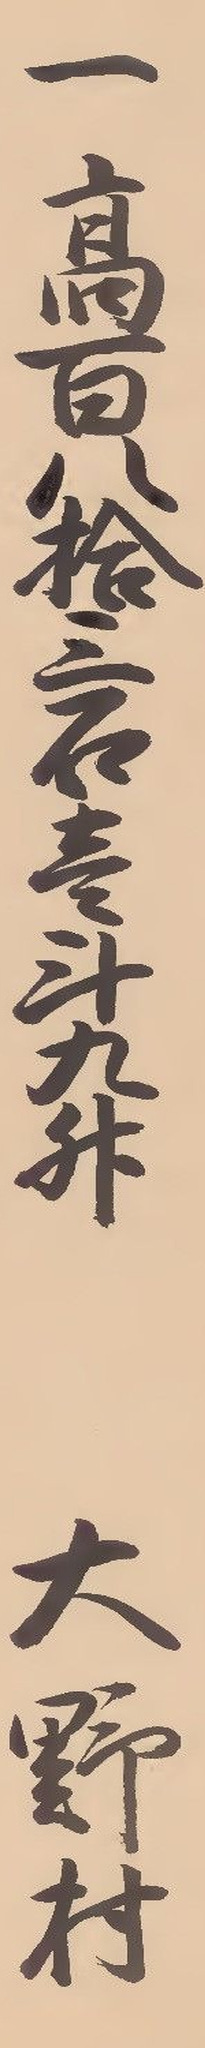一高百八拾三石壱斗九升大野村
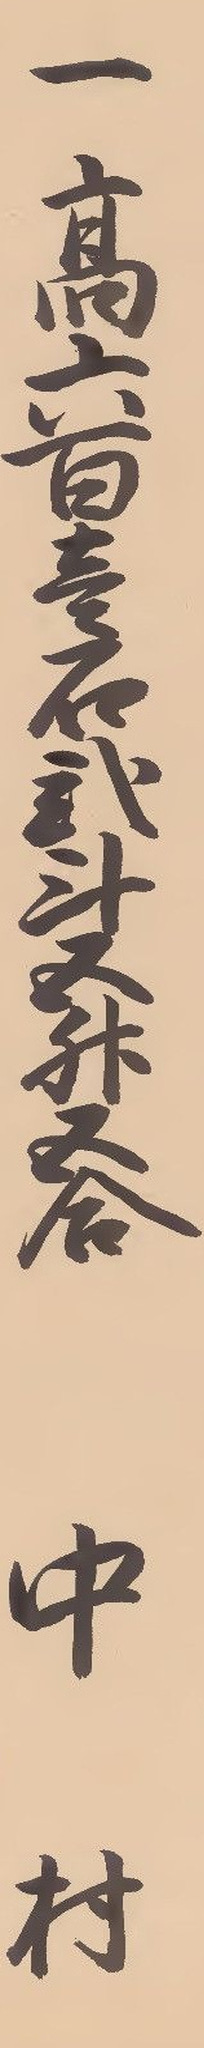一高六百壱石弐斗五升五合中村
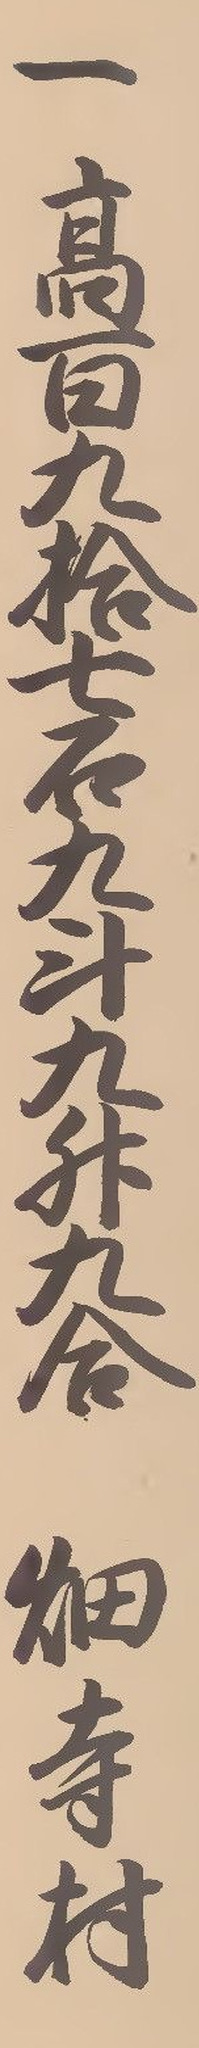一高百九拾七石九斗九升九合畑寺村
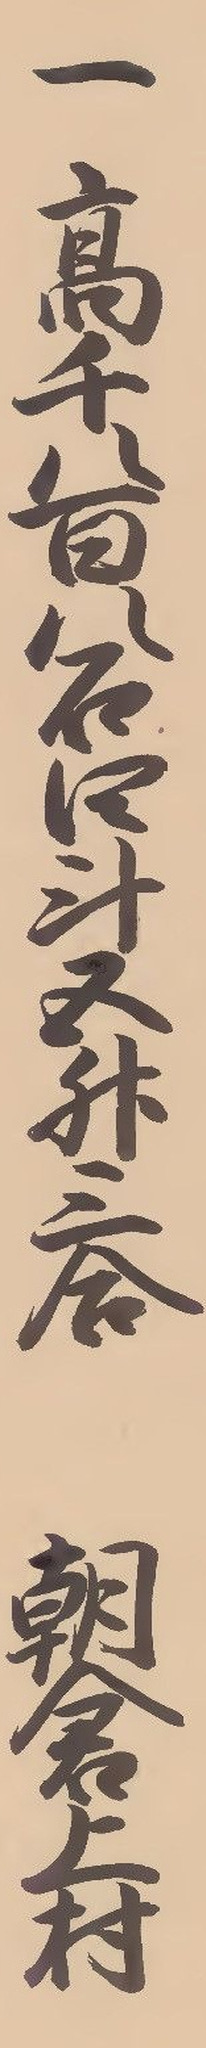一高千八百八石四斗五升三合朝倉上村
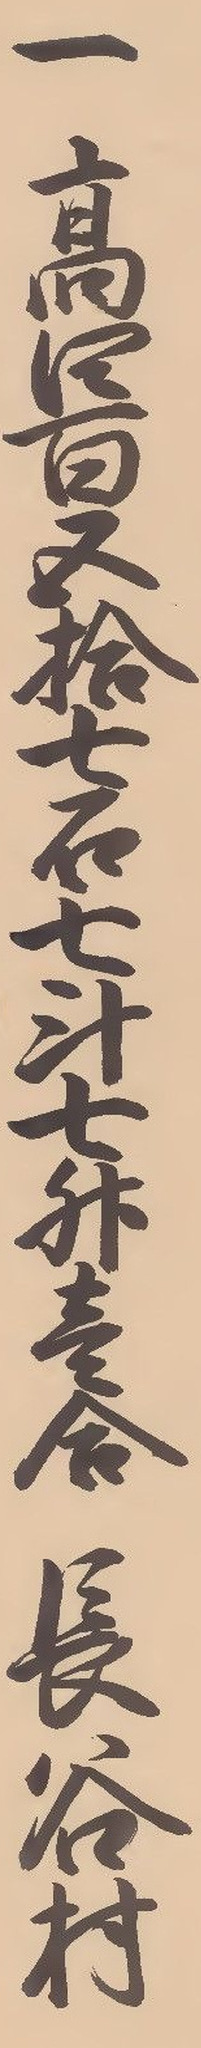一高四百五拾七石七斗七升壱合長谷村

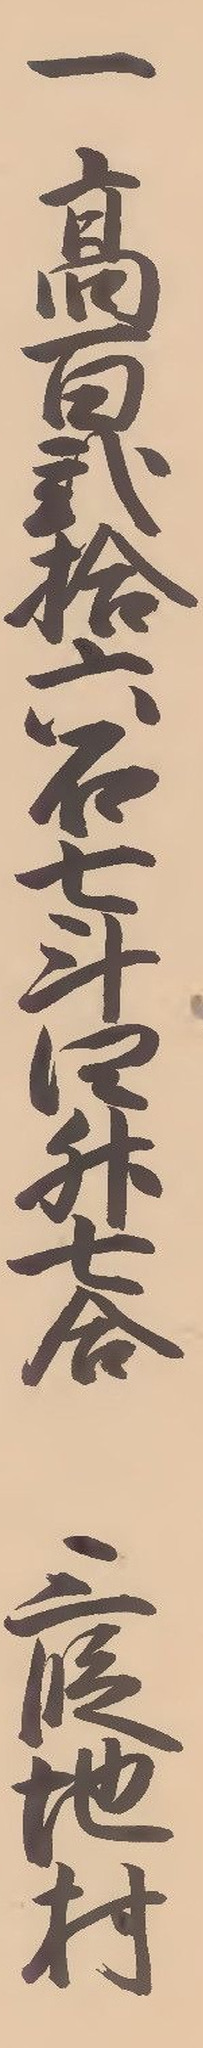一高百弐拾六石七斗四升七合三段地村
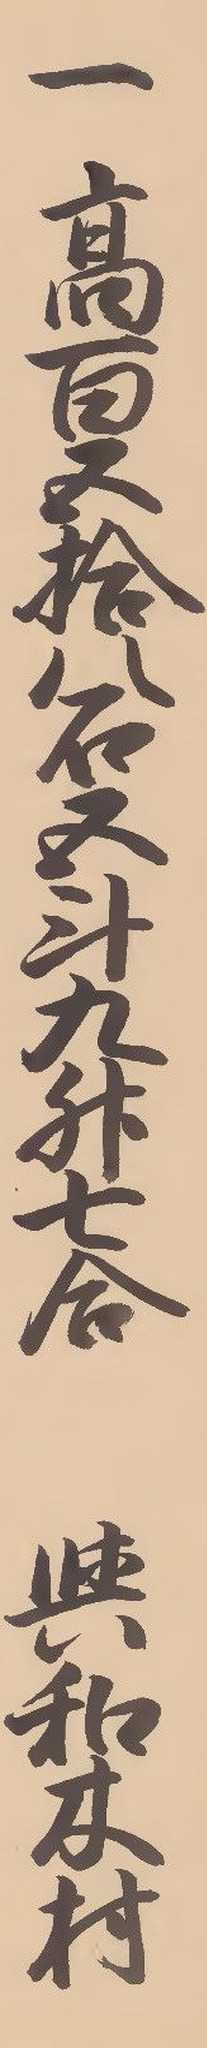一高百五拾八石五斗九升七合与和木村
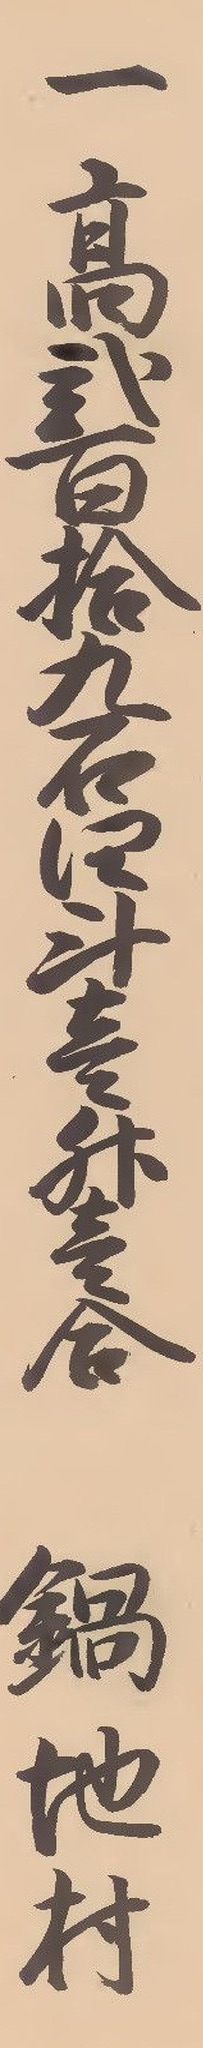一高弐百拾九石四斗壱升壱合鍋地村
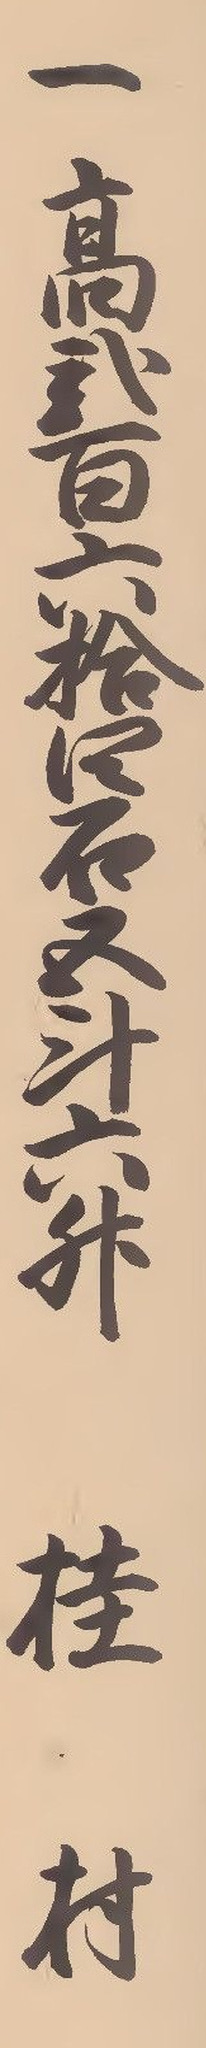一高弐百六拾四石五斗六升桂村
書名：伊予国郷帳
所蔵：国立公文書館 National Archives of Japan
